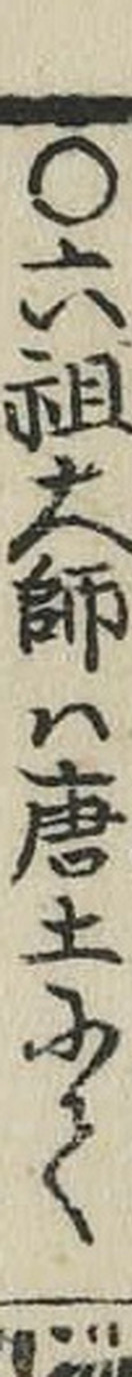○六祖大師は唐土にて
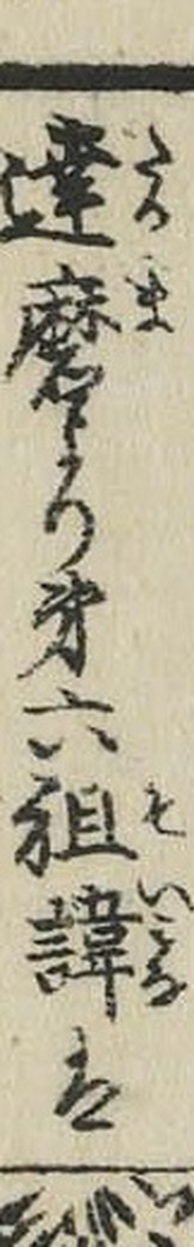達磨より第六祖諱は
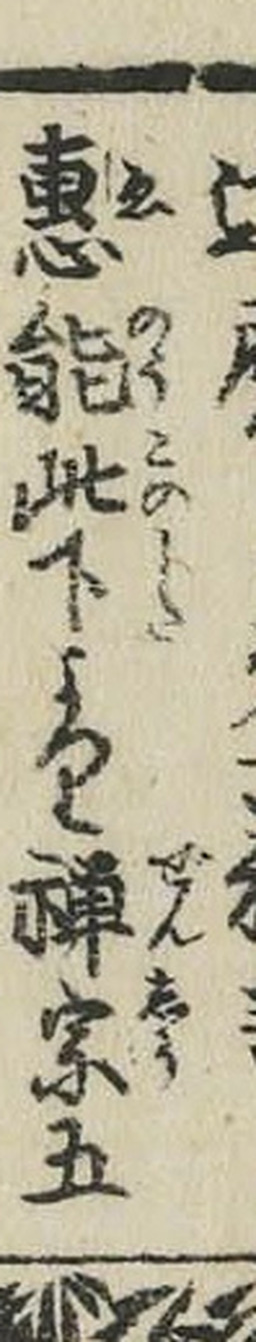恵能此下より禅宗五
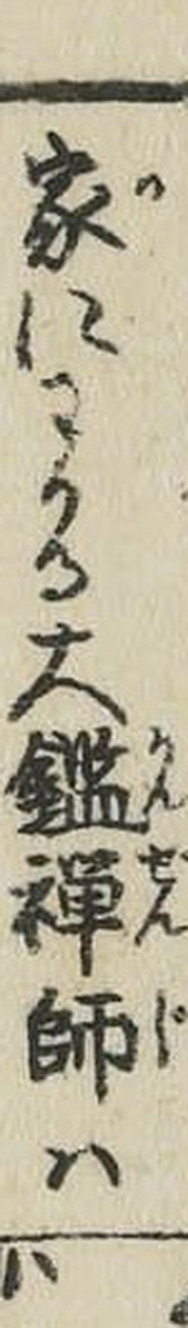家にわかる大鑑禅師は
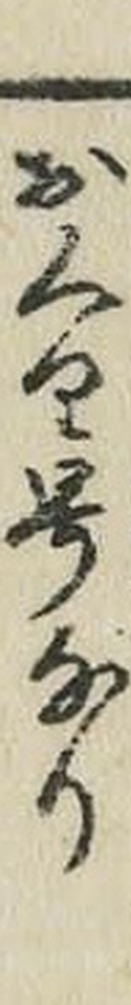おくり号なり
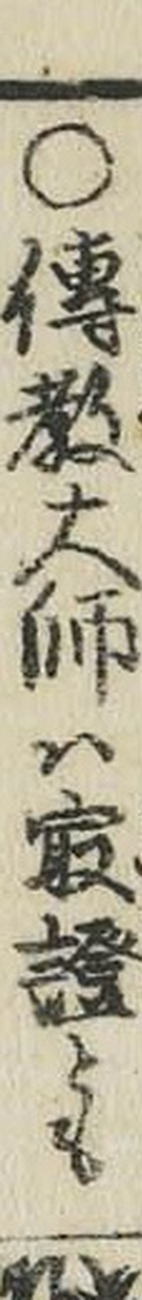○伝教大師は最澄とも
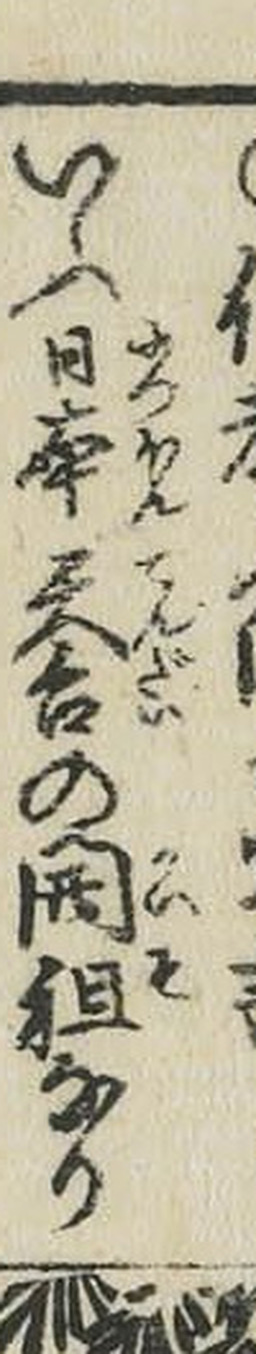いふ日本天台の開祖なり
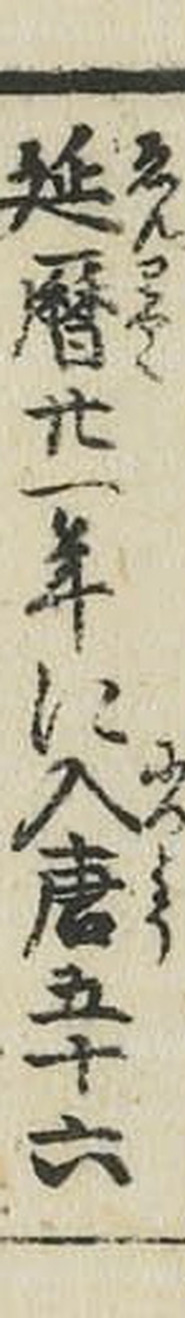延暦廿一年に入唐五十六
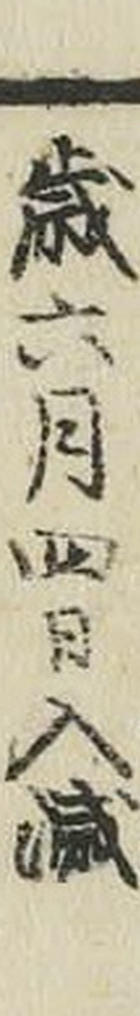歳六月四日入滅
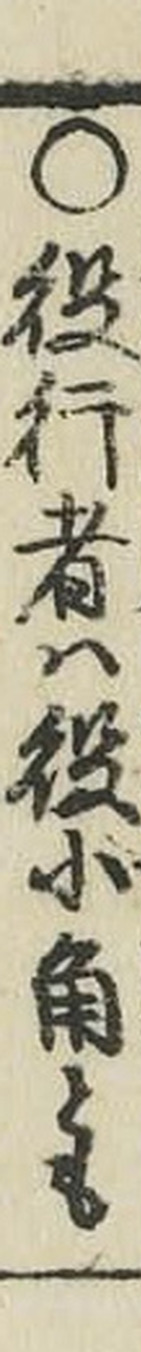○役行者は役小角とも
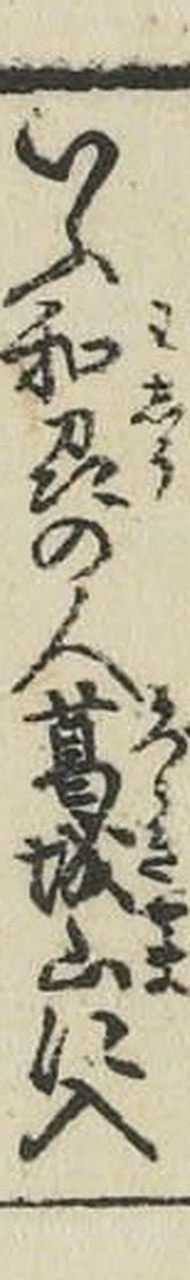いふ和州の人葛城山に入
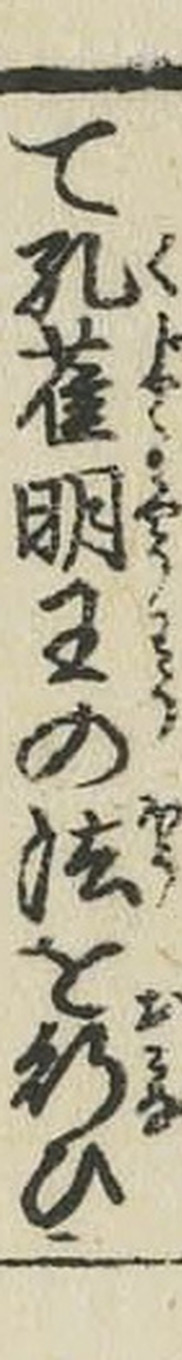て孔雀明王の法を行ひ
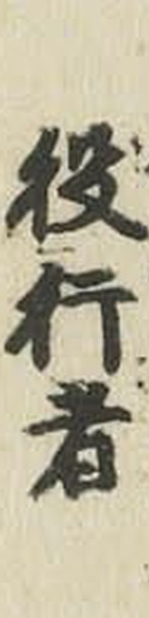役行者
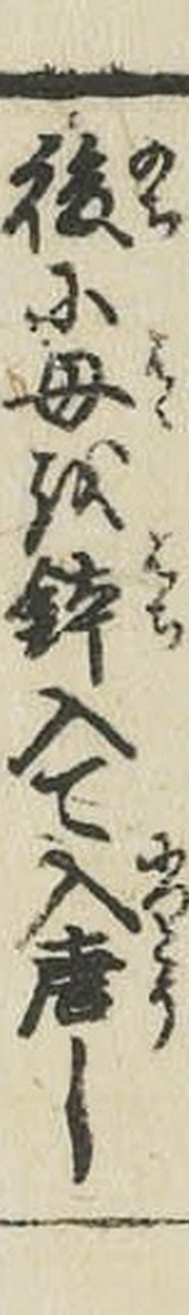後に母を鉢入て入唐し
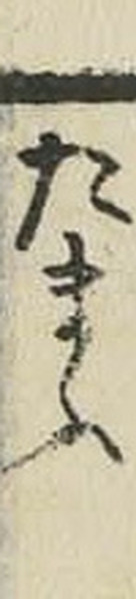たまふ
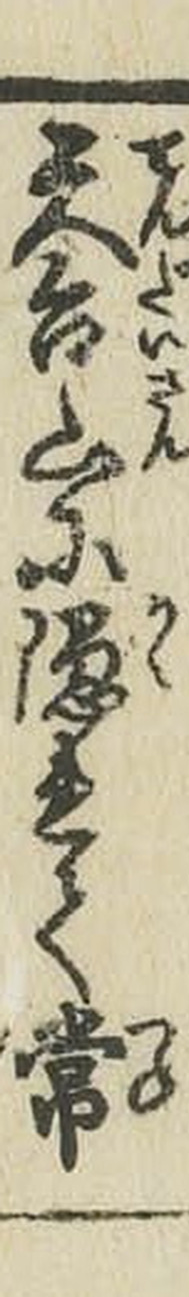天台山に隠れて常
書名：増補頭書訓蒙図彙大成 10巻 10:巻之21
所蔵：東京学芸大学教育コンテンツアーカイブ
